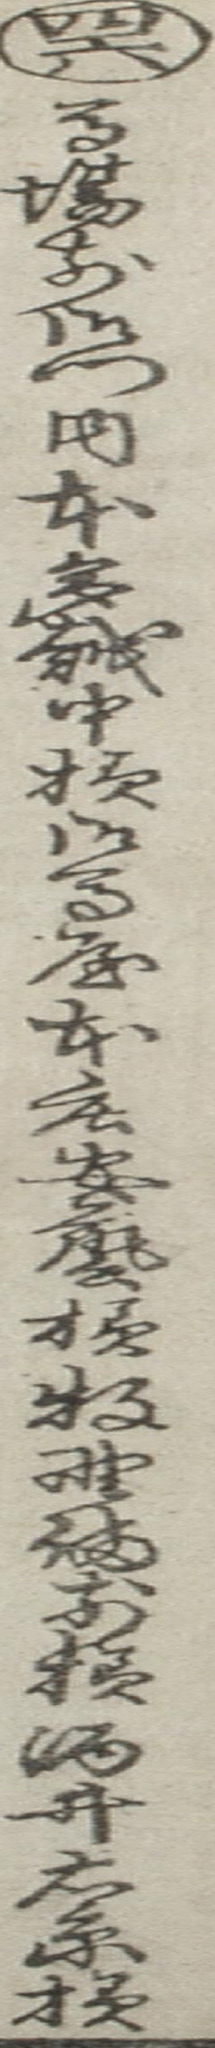馬場前御門内本多越中様御馬屋本庄安芸様牧野備前様酒井右京様
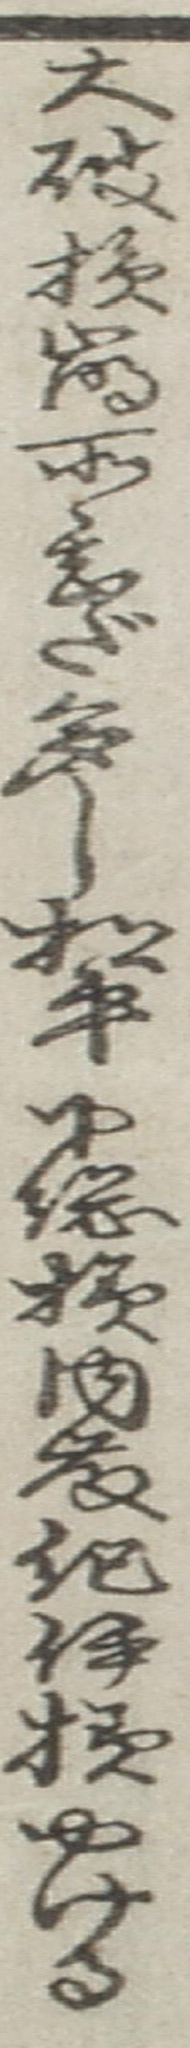大破損崩所々甚だ多し松平下総様内藤紀伊様やける
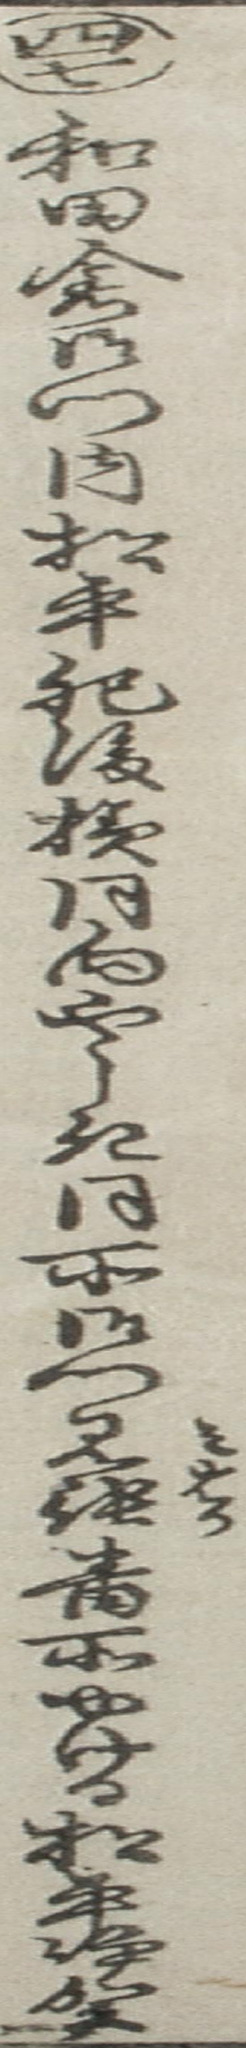和田倉御門内松平肥後様同向やしき同所御門見張番所やける松平伊賀
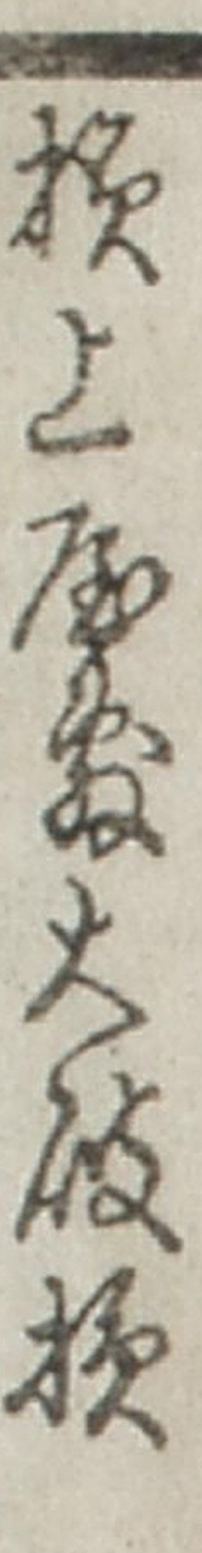様上屋敷大破損
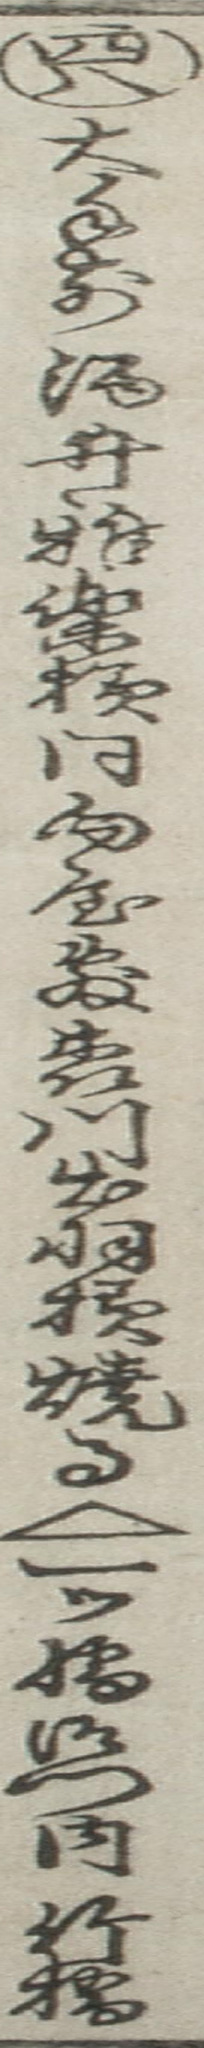大手前酒井雅樂様同向屋敷森川出羽様焼る△一ツ橋御門内竹橋
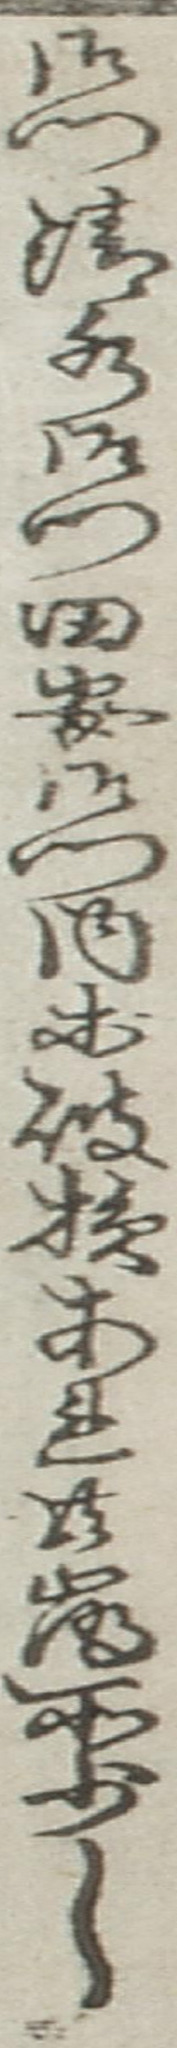御門清水御門田安御門内等破損あれ共崩所少し
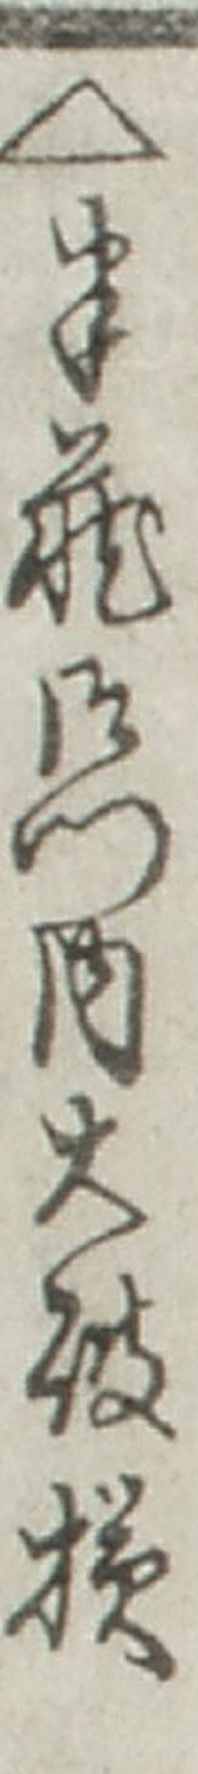△半蔵御門内大破損
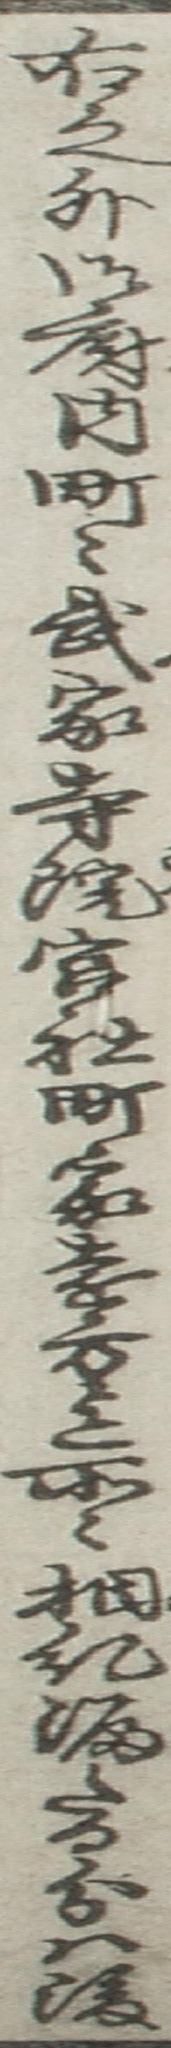右之外御府内町々武家寺院宮社町家遠方迄所々相糺漏たる分は後
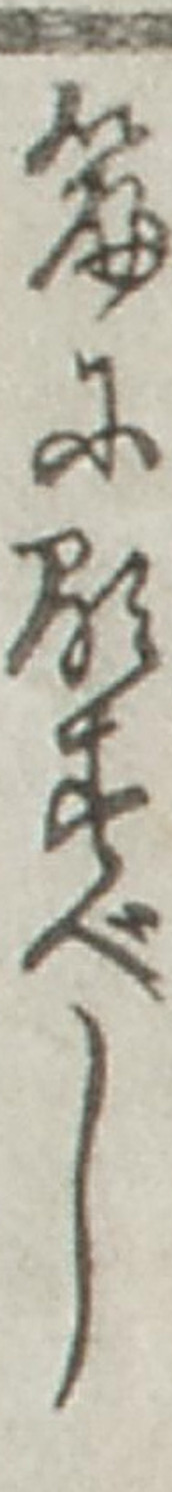篇に顕すべし

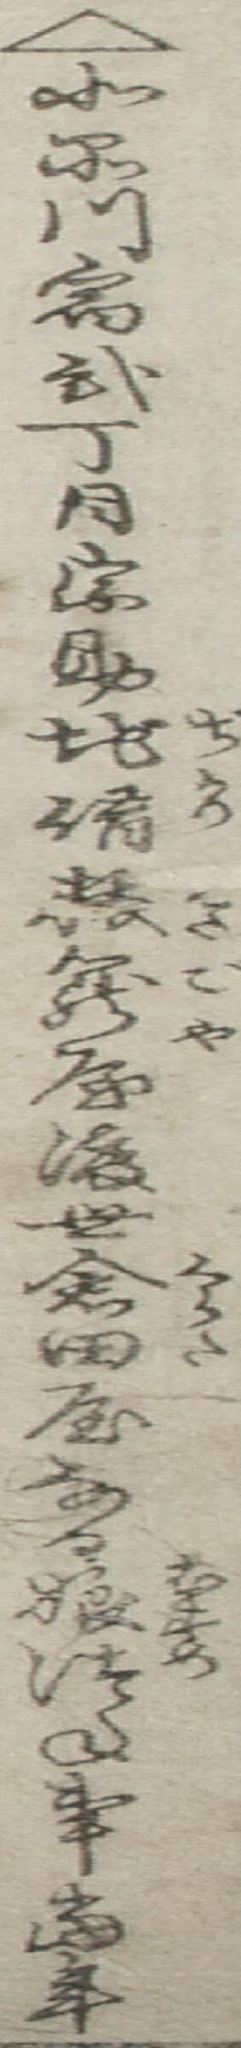△北品川宿弐丁目宗助地借旅籠屋渡世倉田屋なる娘つね事当年
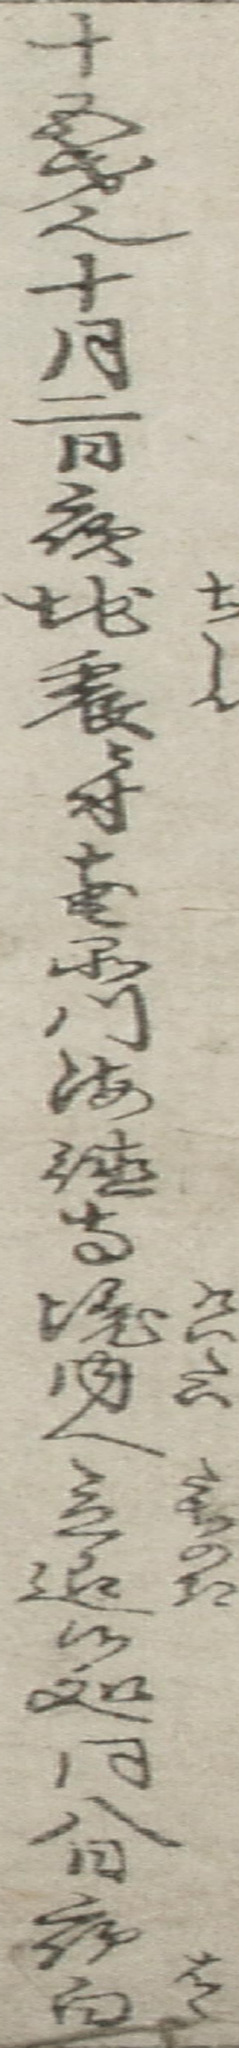十五才也十月二日夜地震に付南品川海徳寺境内へ立退候処同八日夜白
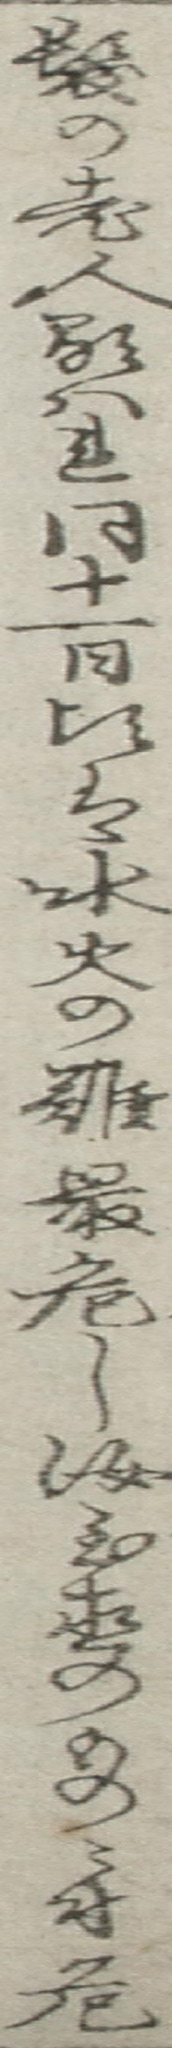髪の老人顕はれ同十一日頃にて水火の難最危し汝至直のものに付危
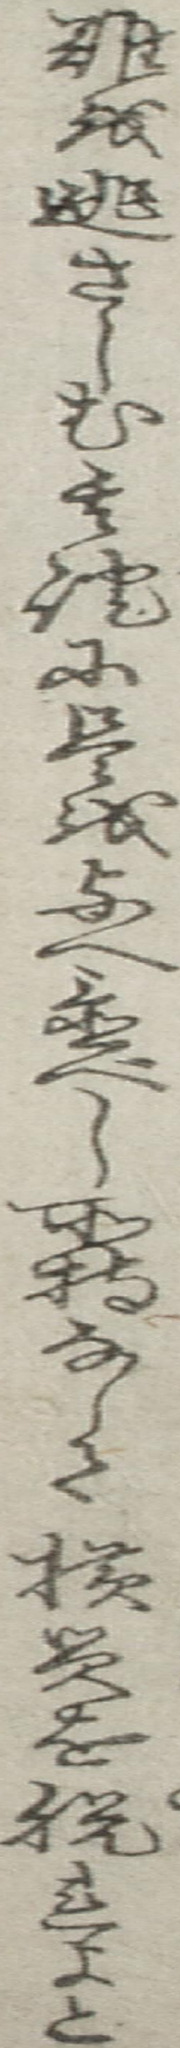難を逃さしむ其證に是を与へ置べし所持なして横災を脱れよと
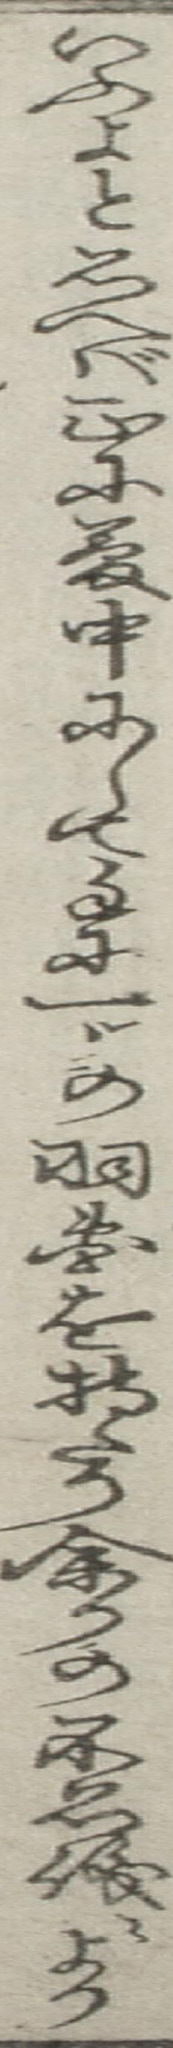いふよと思へば正に夢中にして手に一ツの羽団を持たり余りの不思儀により
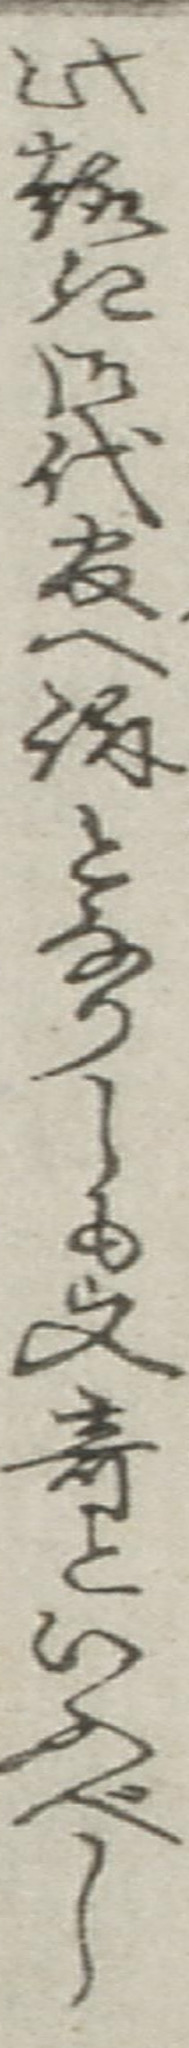此趣き御代官へ訴となりしも又奇といふべし
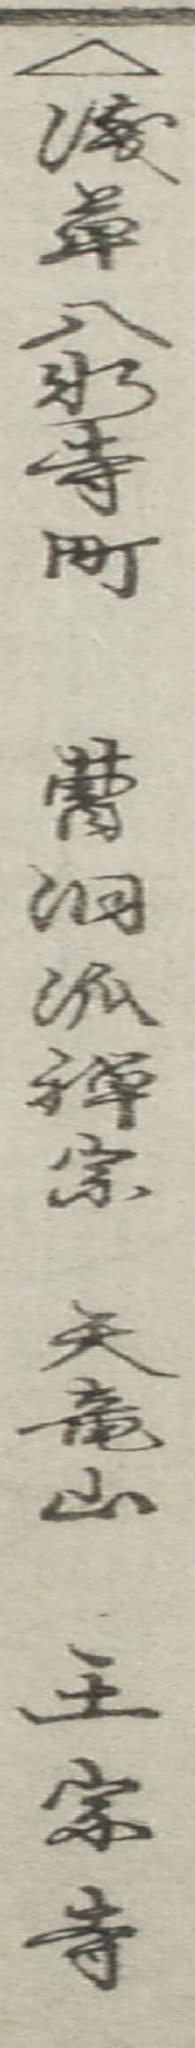△浅草八軒寺町曹洞派禅宗天竜山玉宗寺
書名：安政見聞誌　下
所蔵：東京大学地震研究所図書室 Earthquake Research Institute Library, The University of Tokyo, JAPAN
